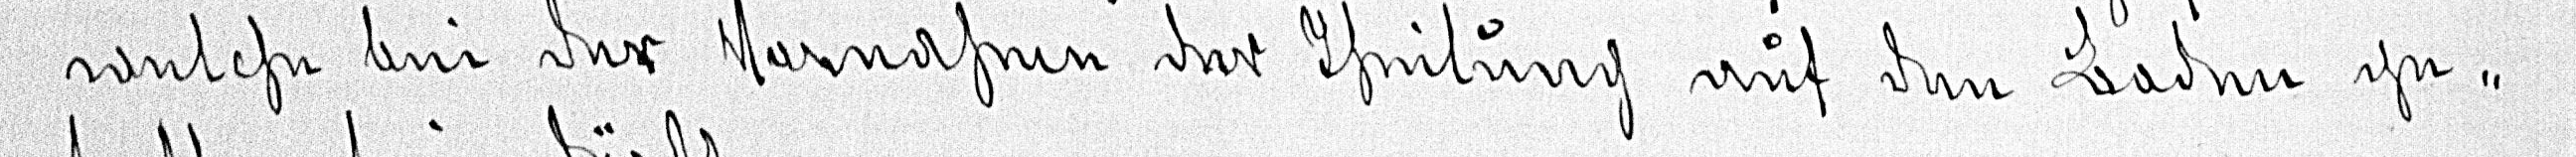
welche bei der Vornahme der Theilung auf den Boden ge¬
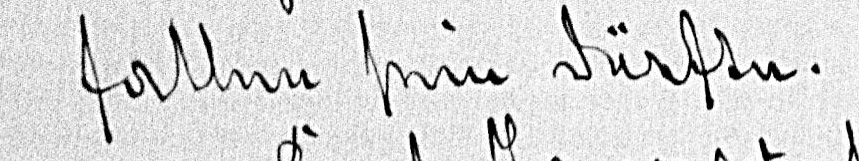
fallen sein dürfte.
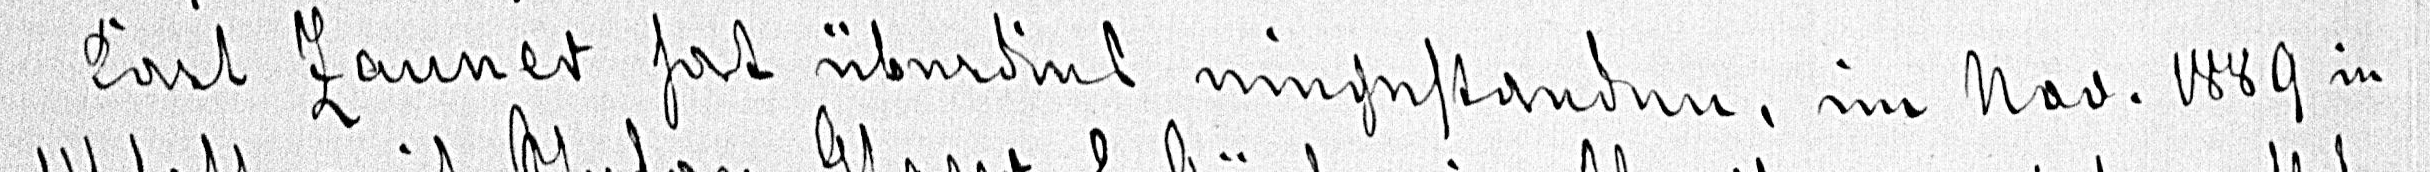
Karl Zauner hat überdies eingestanden, im Nov. 1889 in
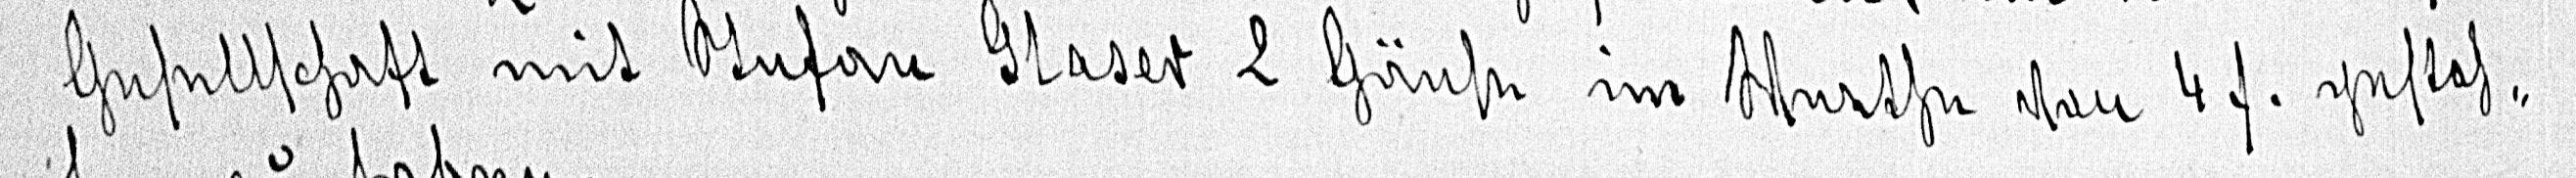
Gesellschaft mit Stefan Glaser 2 Gänse im Werthe von 4 f. gestoh¬
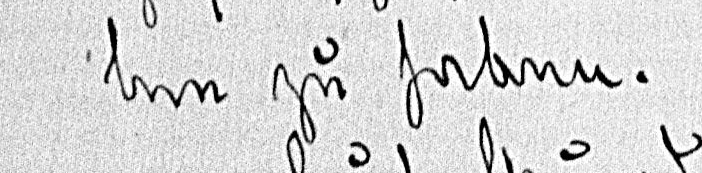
len zu haben.
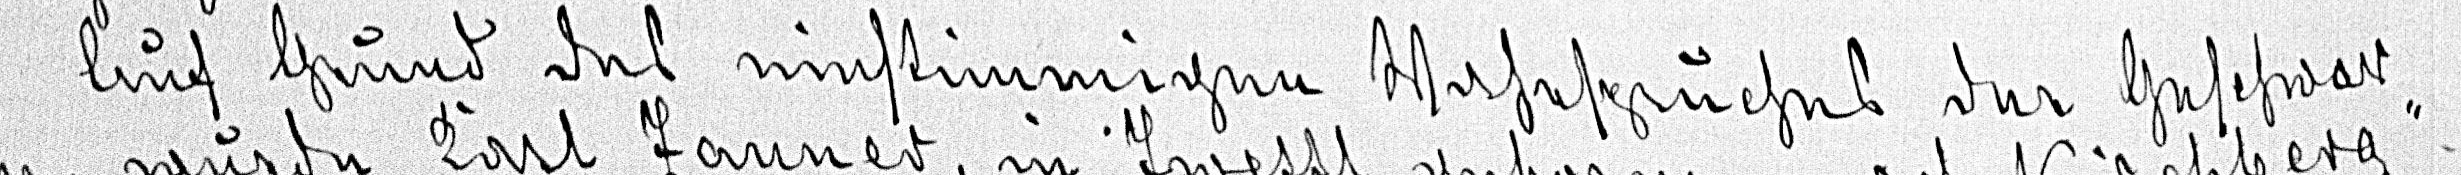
Auf Grund des einstimmigen Wahrspruches der Geschwor¬
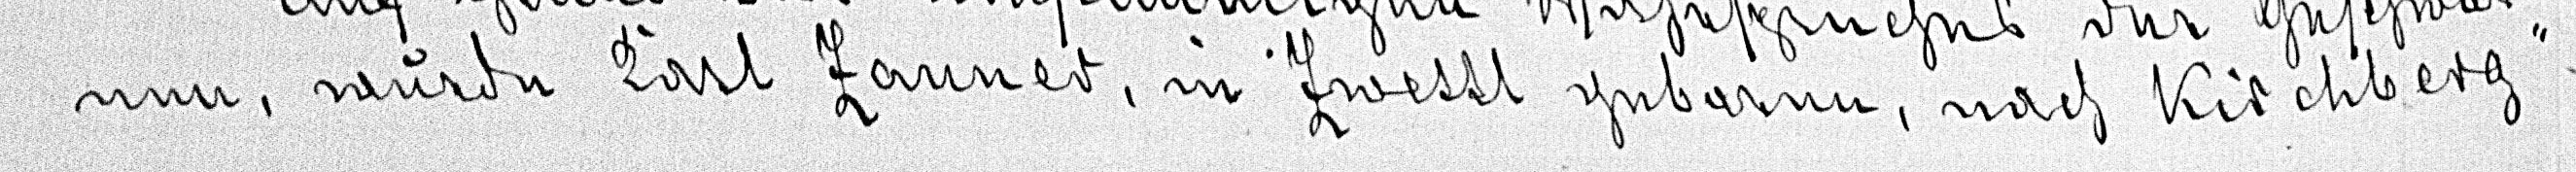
nen, wurde Karl Zauner, in Zwettl geboren, nach Kischberg
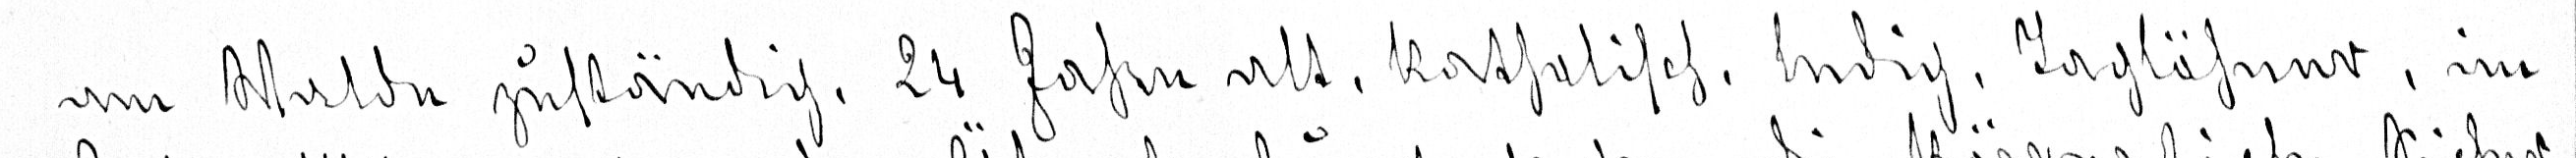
am Walde zuständig, 24 Jahre alt, katholisch, ledig, Taglöhner, im
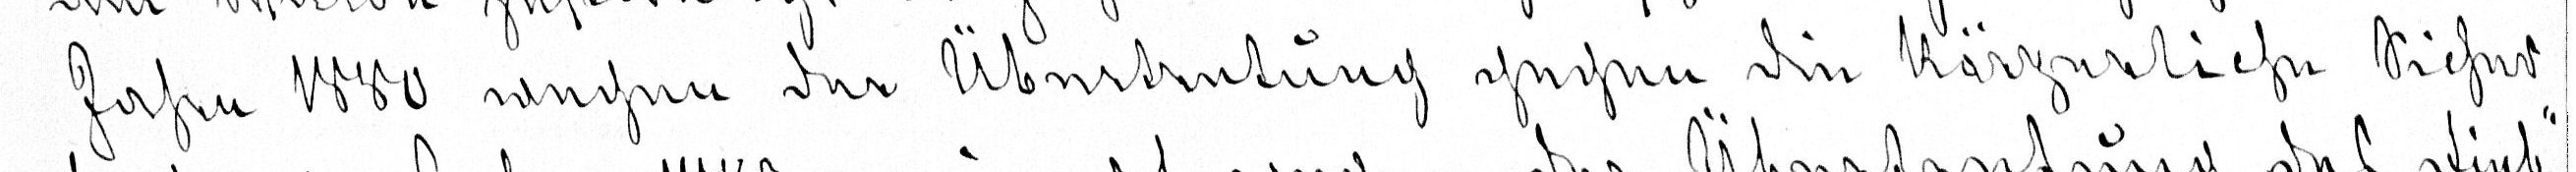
Jahre 1880 wegen der Übertretung gegen die körperliche Sicher¬
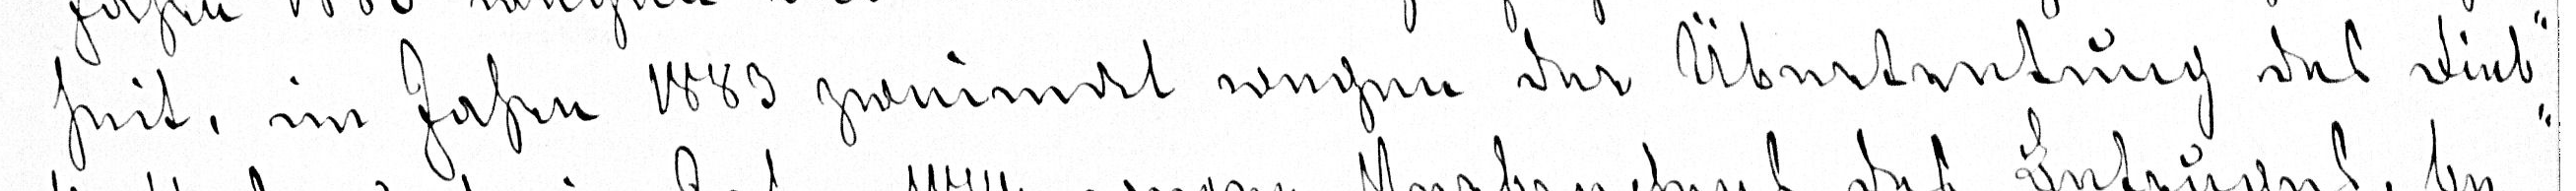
heit, im Jahre 1883 zweimal wegen der Übertretung des Dieb¬
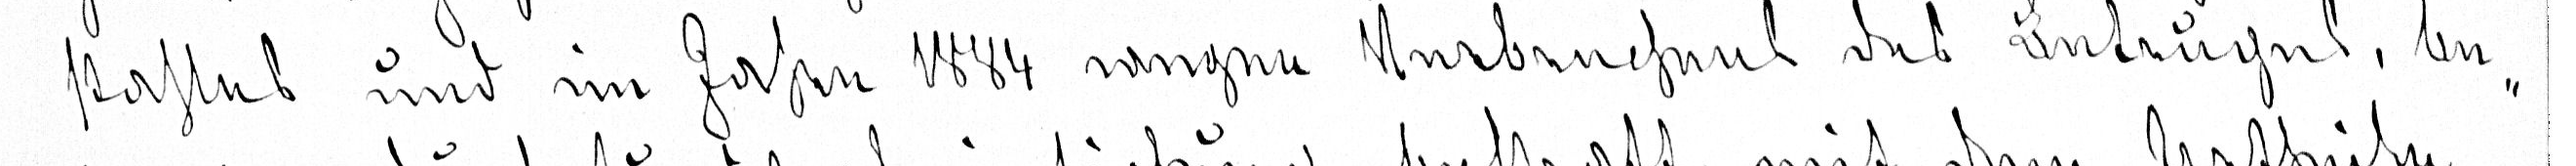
stahles und im Jahre 1884 wegen Verbrechens des Betruges, be¬
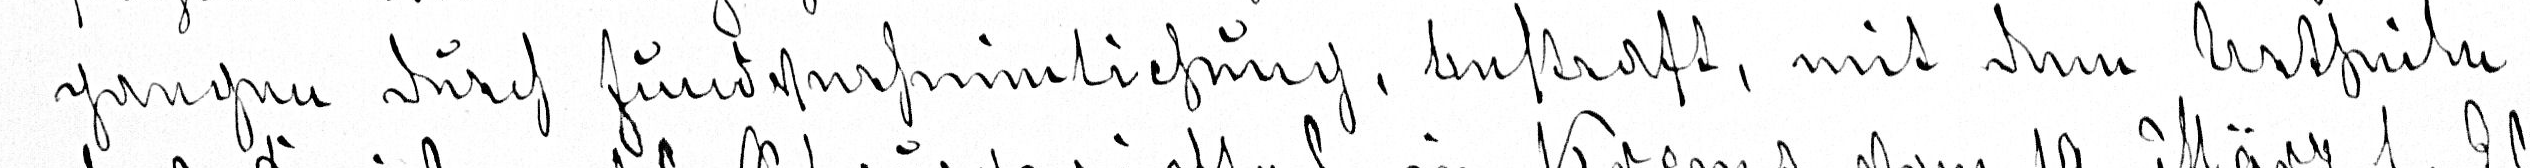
gangen durch Fundverheimlichung, bestraft, mit dem Urtheile
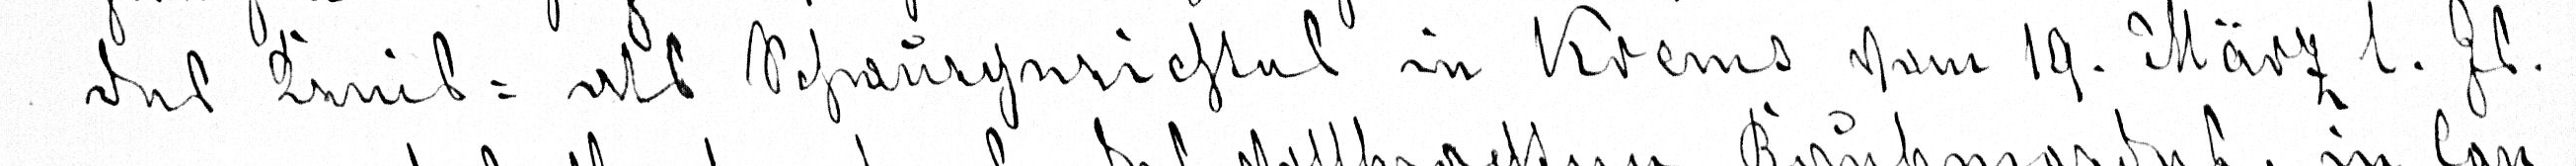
des Kreis = als Schwurgerichtes in Krems vom 19. März 1. Zs.
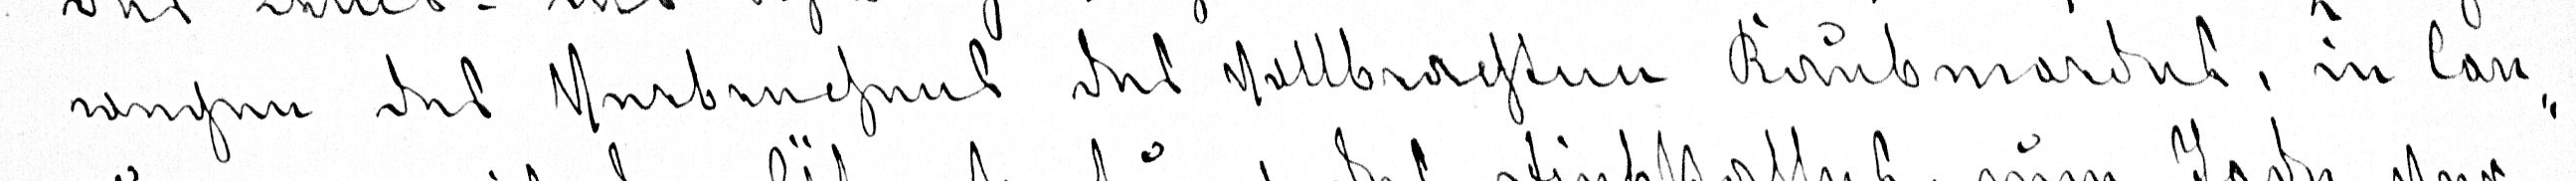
wegen des Verbrechens des vollbrachten Raubmordes, in Con¬
